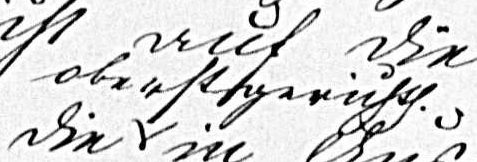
oberstgerichtl.
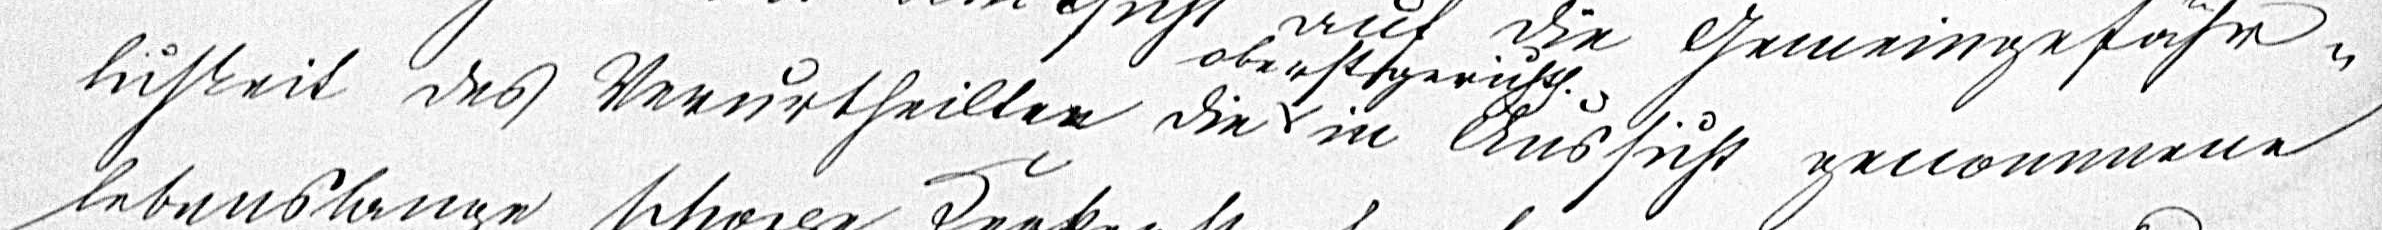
lichkeit des Verurtheilten die In Aussicht genommene
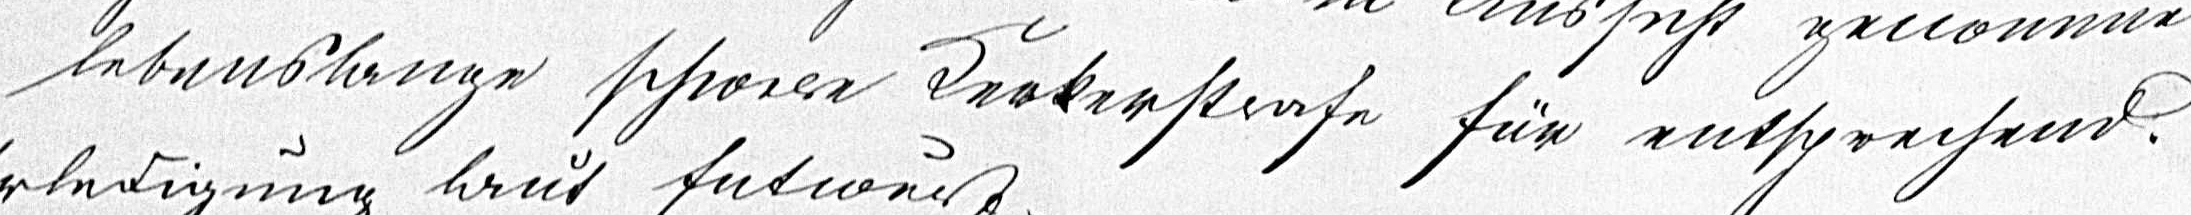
lebenslange schwere Kerkerstrafe für entsprechend.
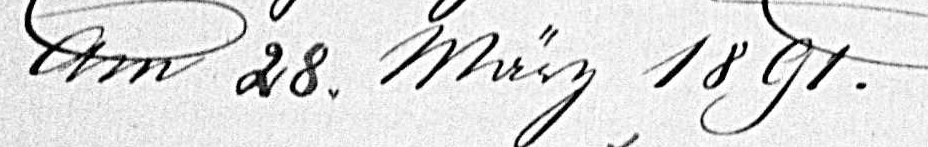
Am 28. März 1891.
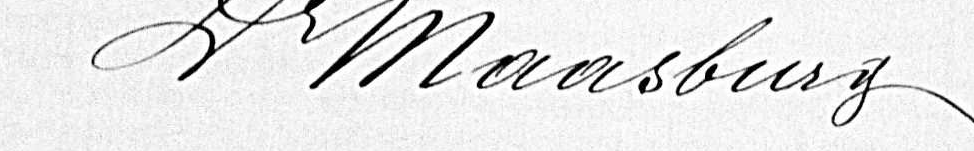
Dr. Maasburg
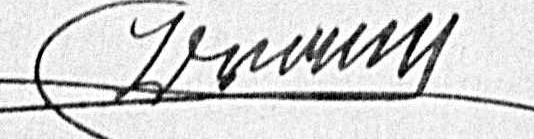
Braun
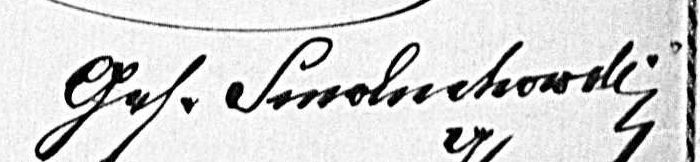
Ges. Smolnchowski
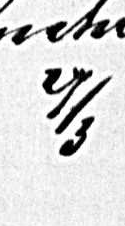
21/3
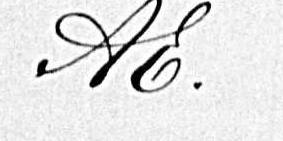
AE
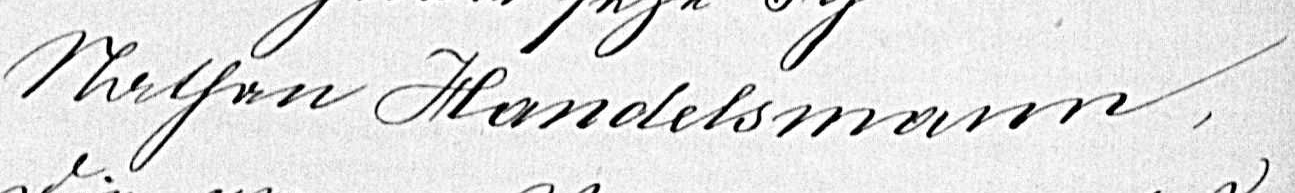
Nathan Handelsmann
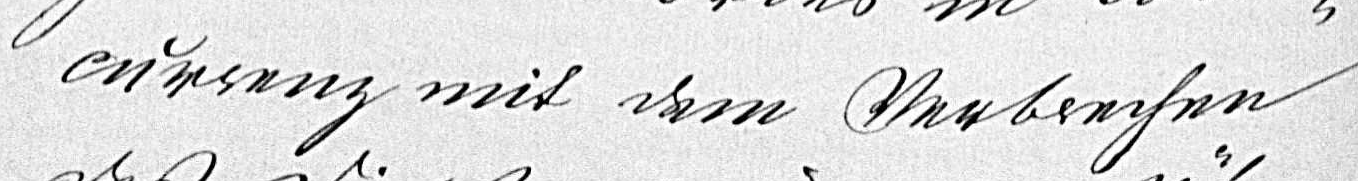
currenz mit dem Verbrechen
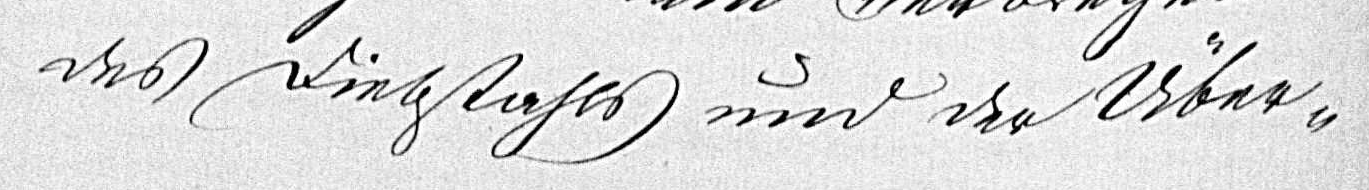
des Diebstahls und der Über¬
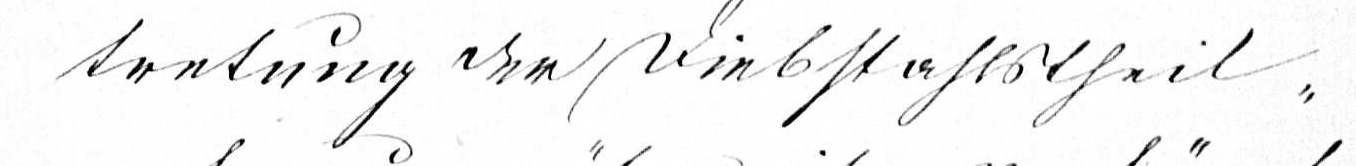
tretung der Diebstahlstheil¬
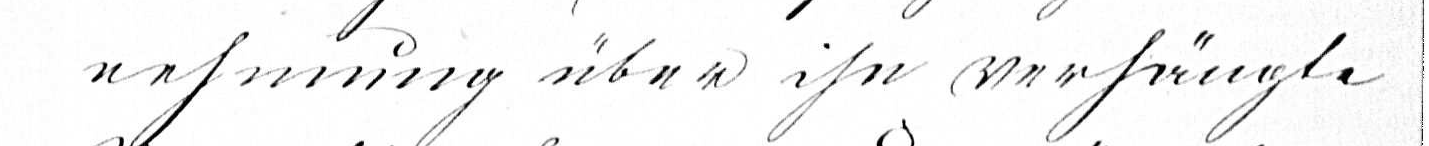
nehmung über ihn verhängte
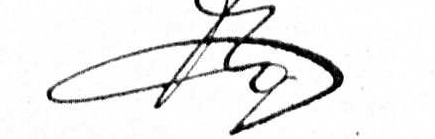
FJ
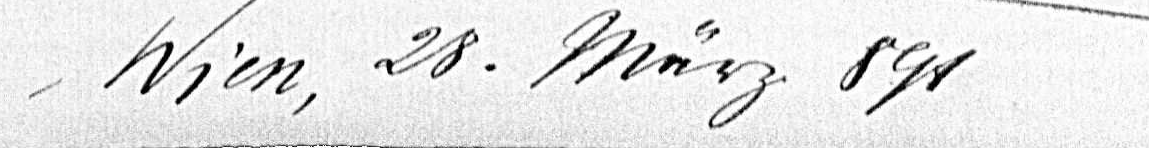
Wien, 28. März 1891
